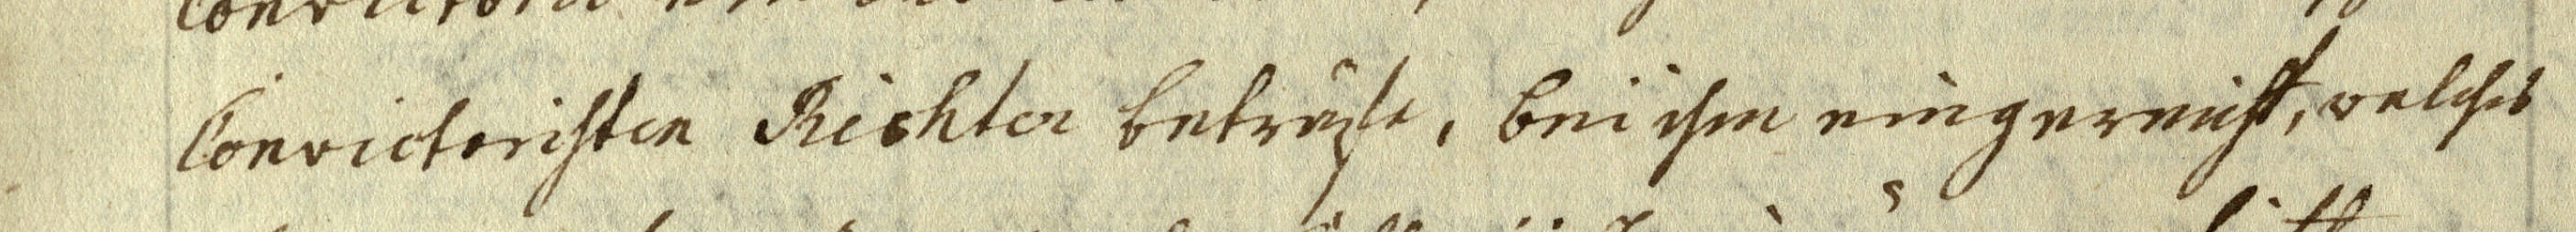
Convictoristen Richter beträfe, bei ihm eingereicht, welches
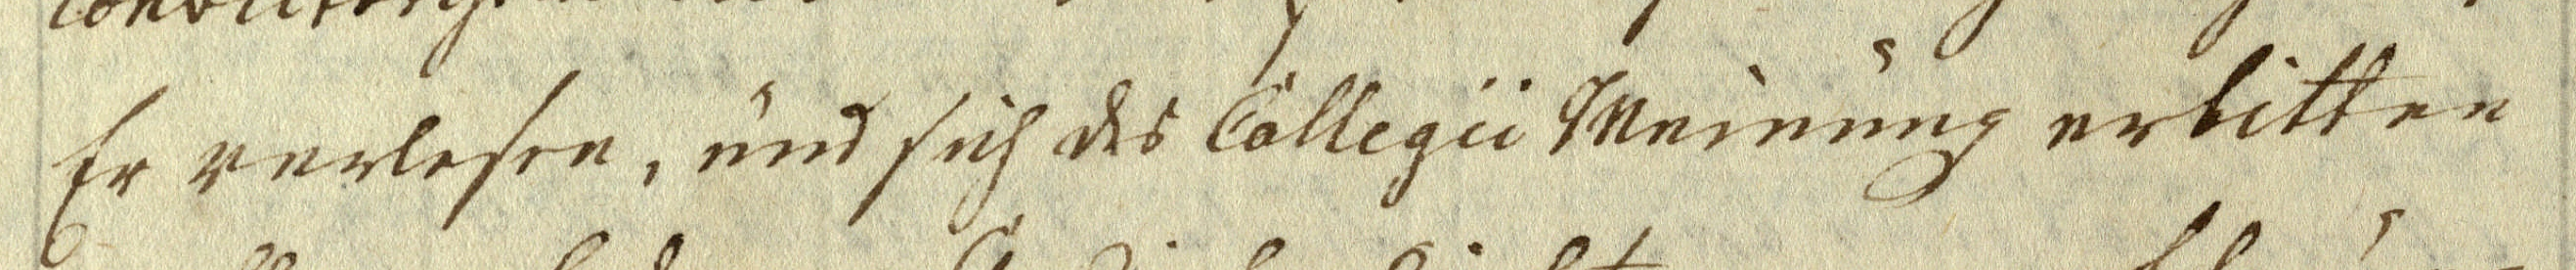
Er verlesen, und sich des Collegii Meinung erbitten
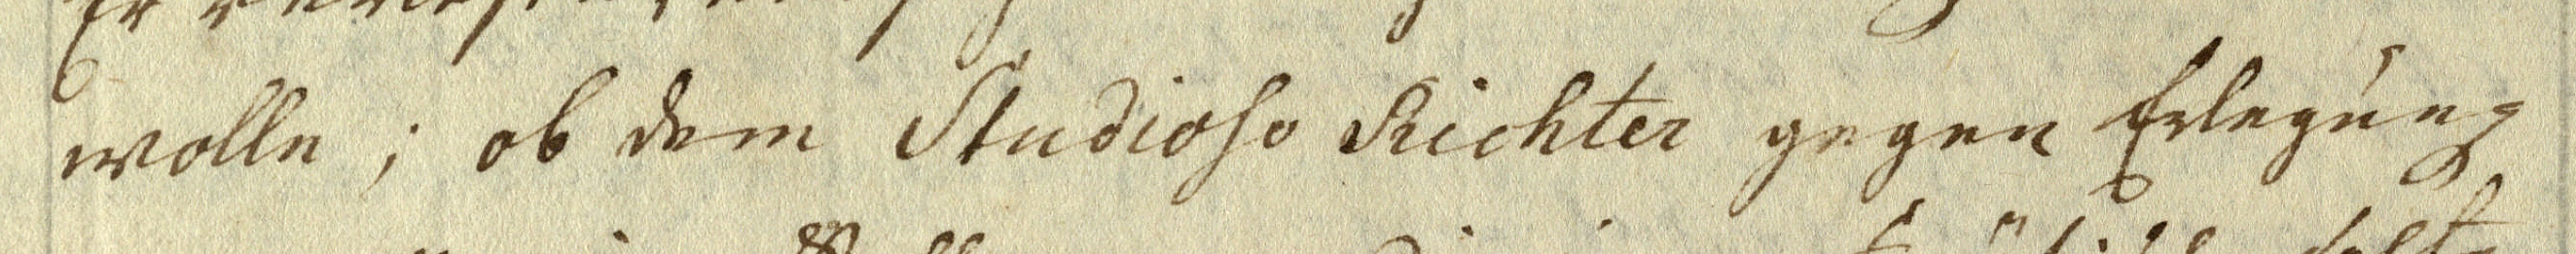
wolle; ob dem Studioso Richter gegen Erlegung
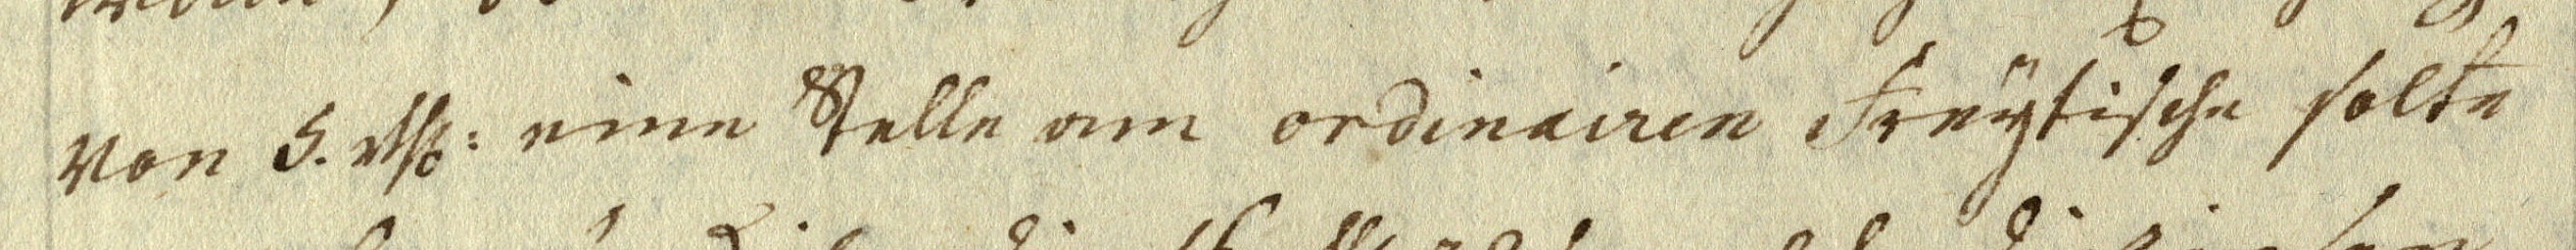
von 5 rtl. eine Stelle am ordinairen Freÿtische solte
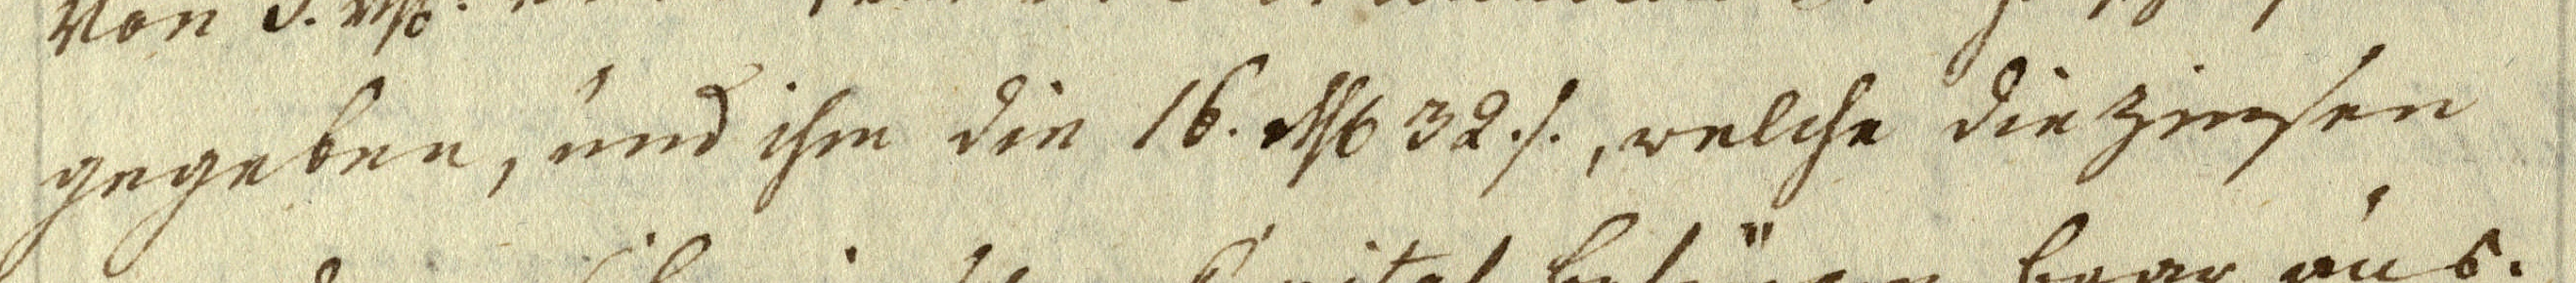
gegeben, und ihm die 16 r: 32. s., welche die Zinsen
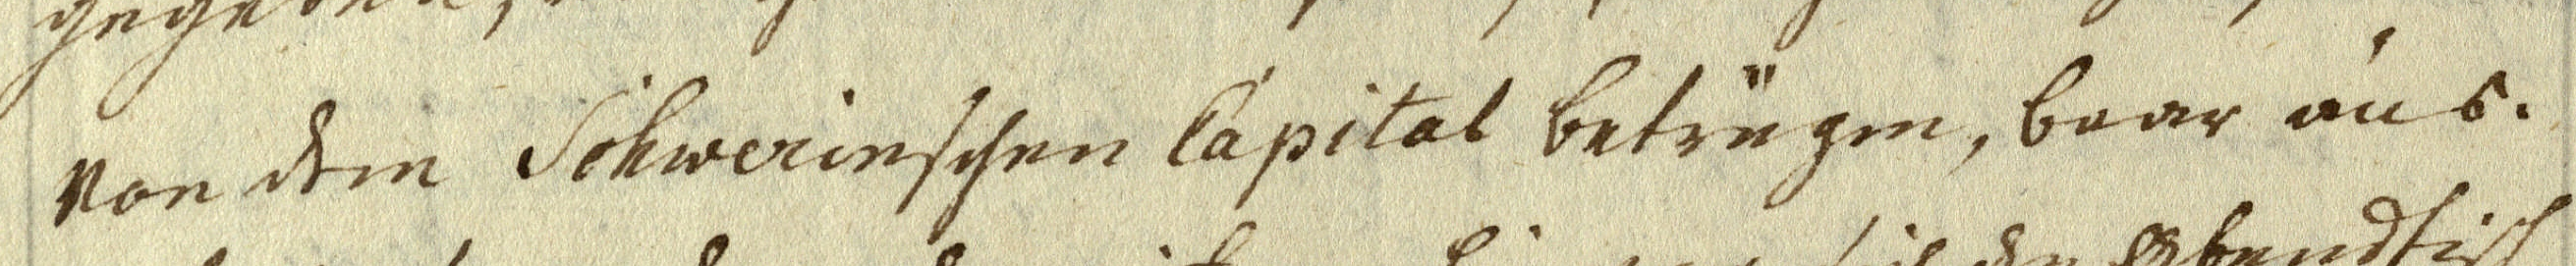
von dem Schwerinschen Capital betrügen, baar aus¬
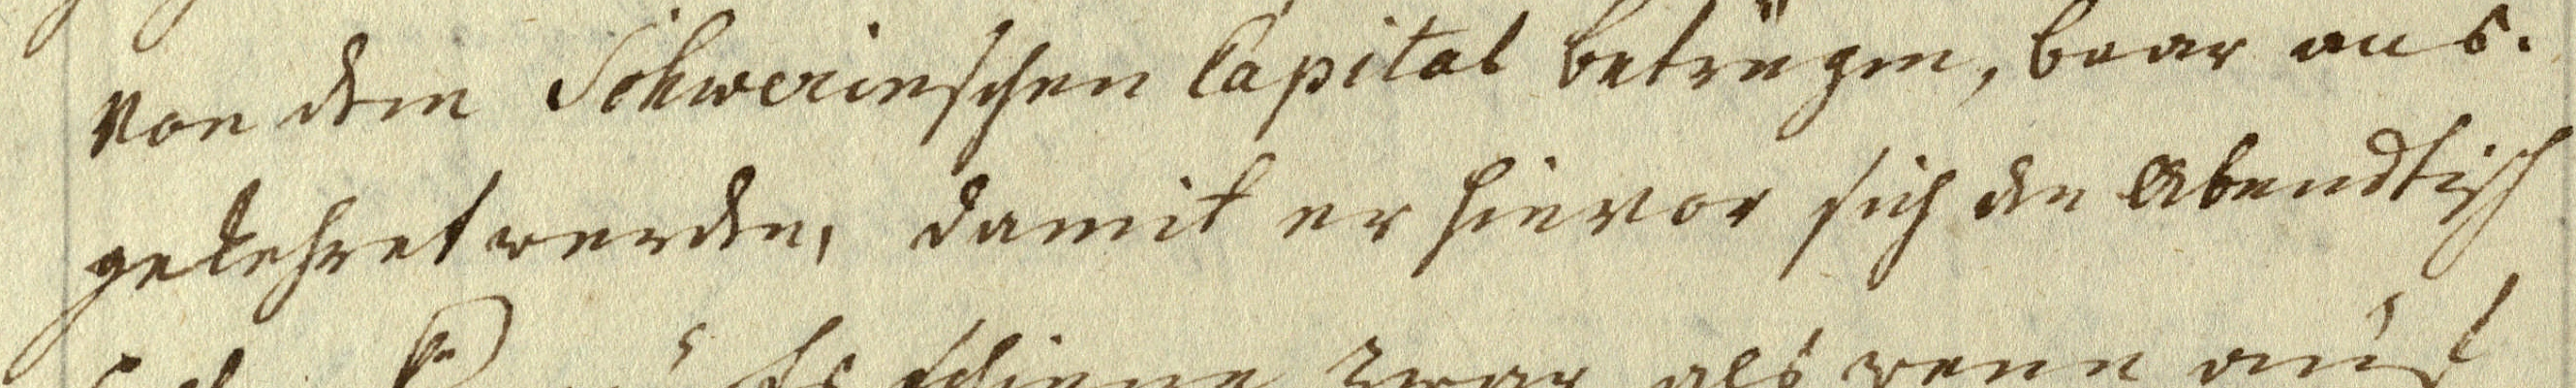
gekehret werden, damit er hievor sich den Abendtisch
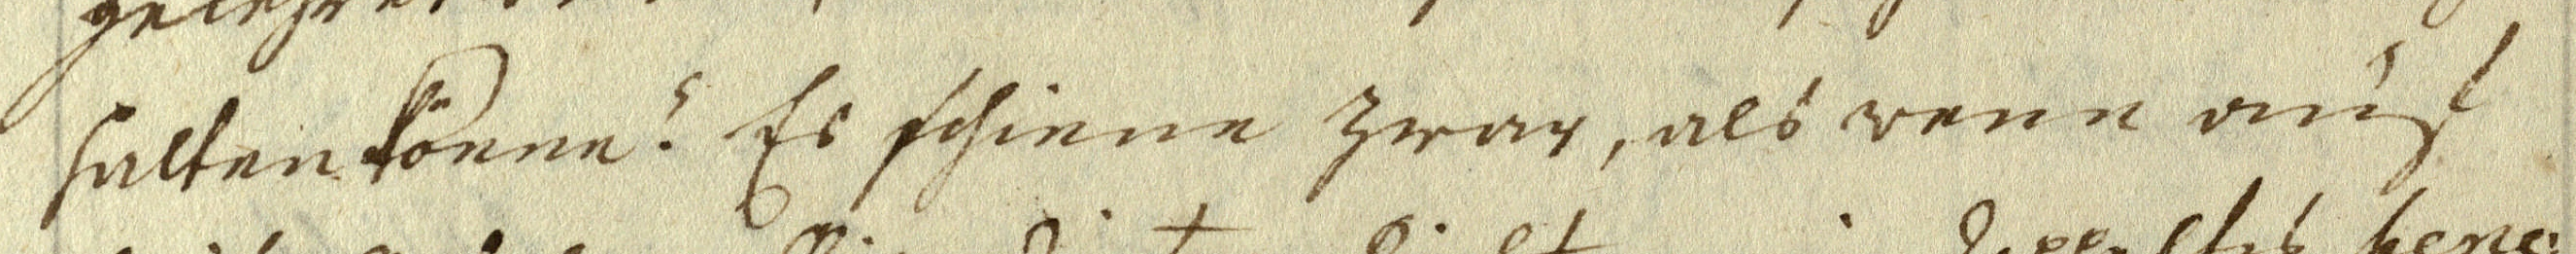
halten könne? Es schiene zwar, als wenn auf
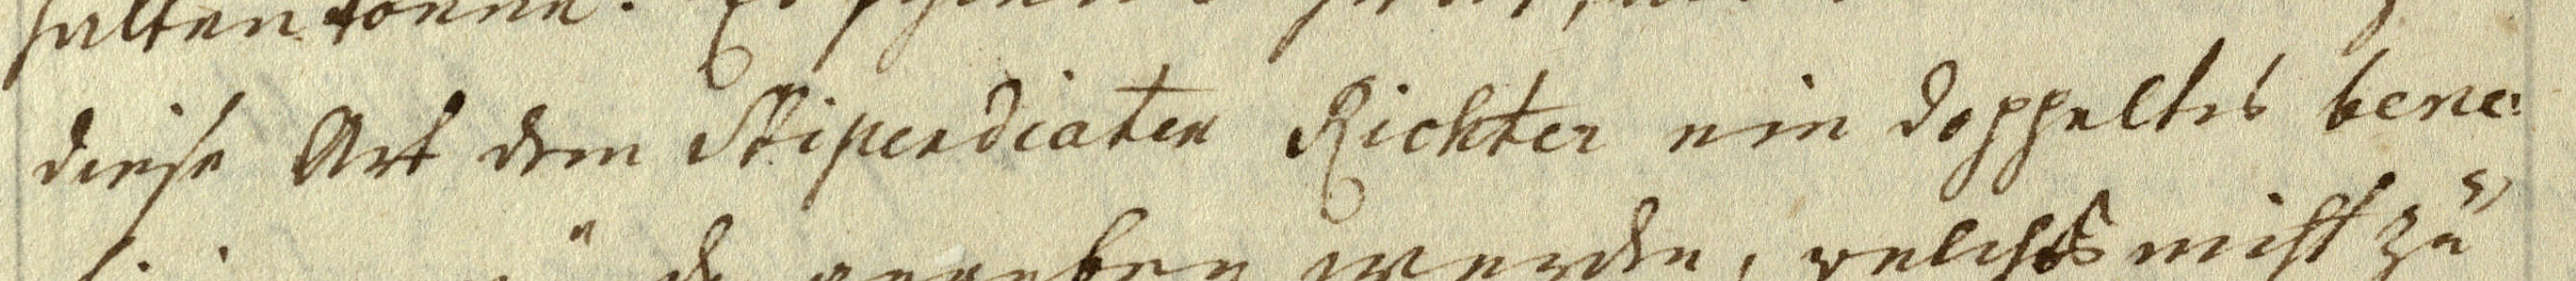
diese Art dem Stipendiaten Richter ein doppeltes bene¬
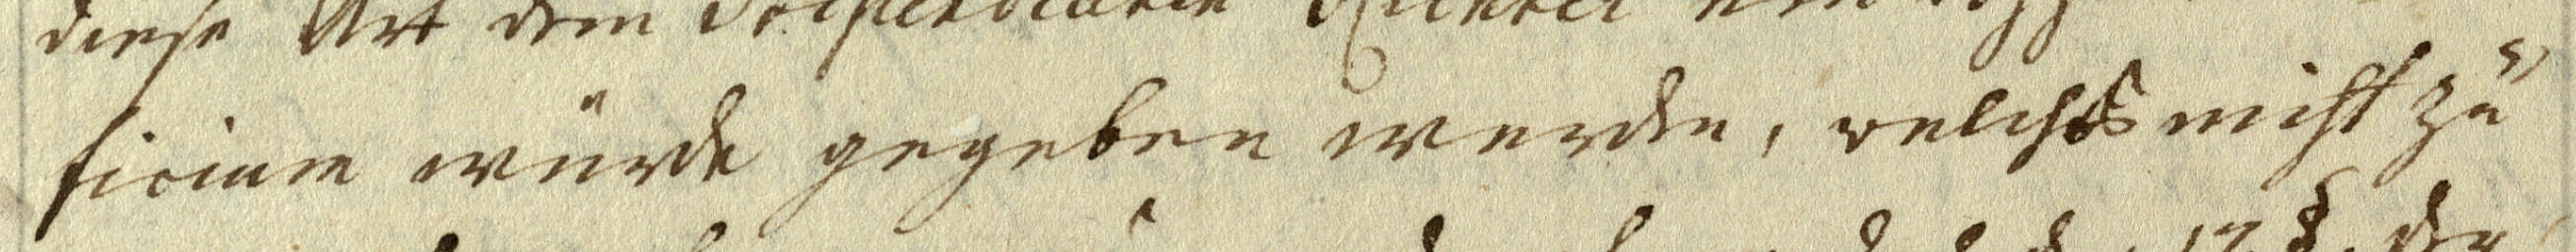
ficium würde gegeben werden, welches nicht zu
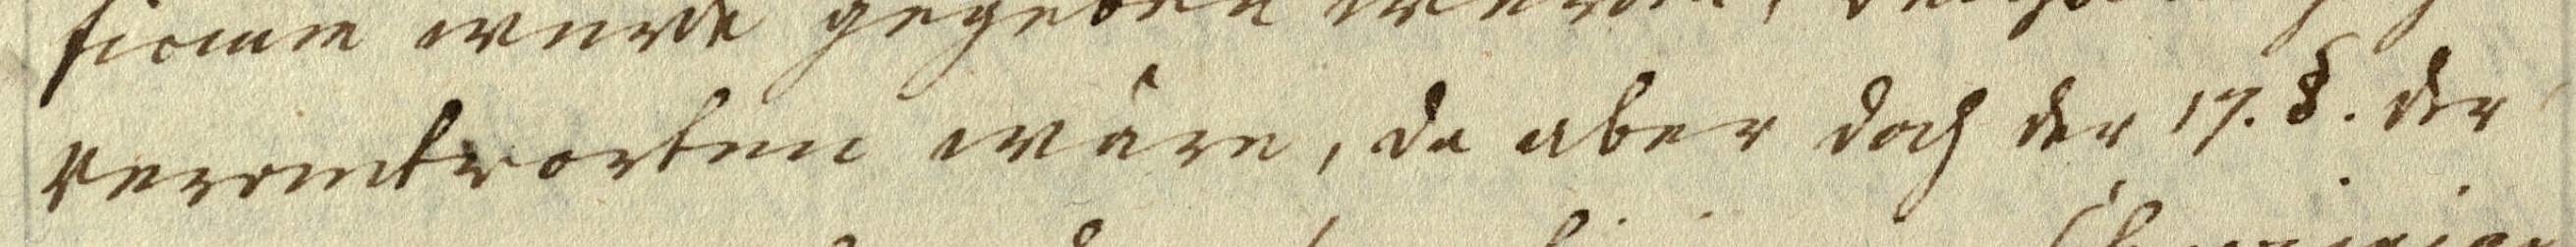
verantworten wäre, da aber doch der 17.§. der
